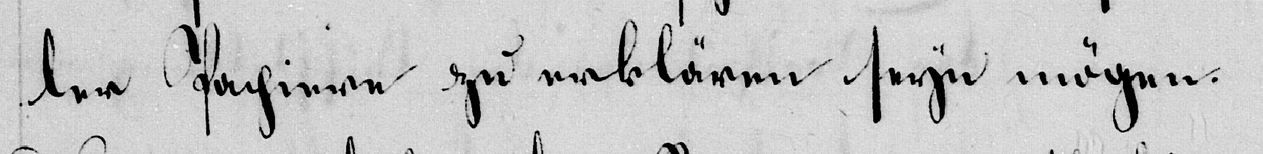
ler Papiere zu erklären seyn mögen.
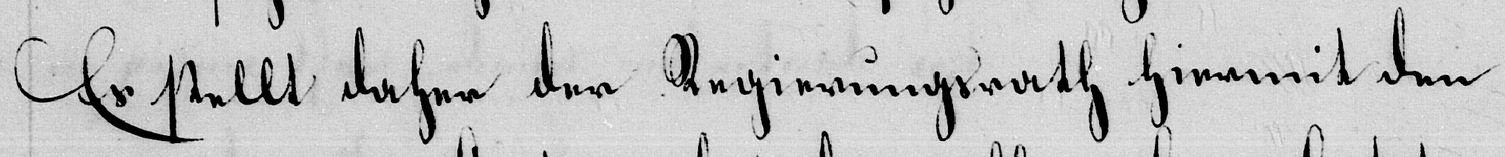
Es stellt daher der Regierungsrath hiermit den
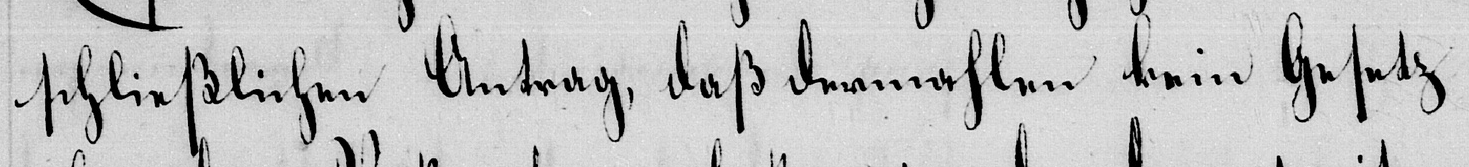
schließlichen Antrag, daß dermahlen kein Gesetz
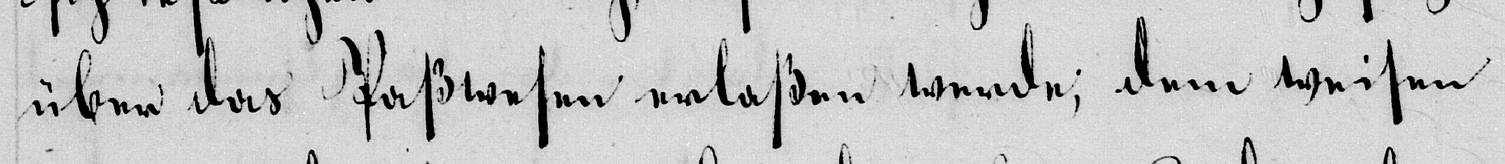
über das Paßwesen erlaßen werde; dem weisen
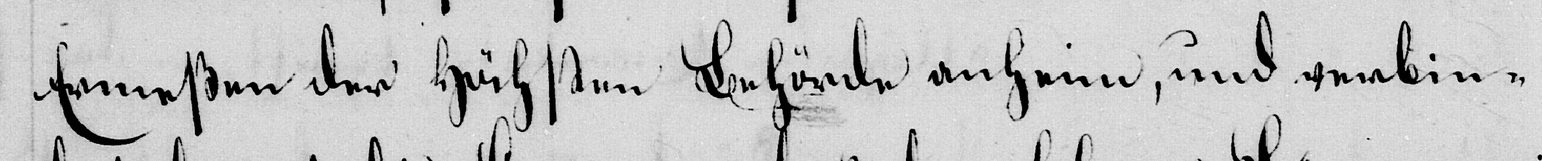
Ermeßen der Höchsten Behörde anheim, und verbin¬
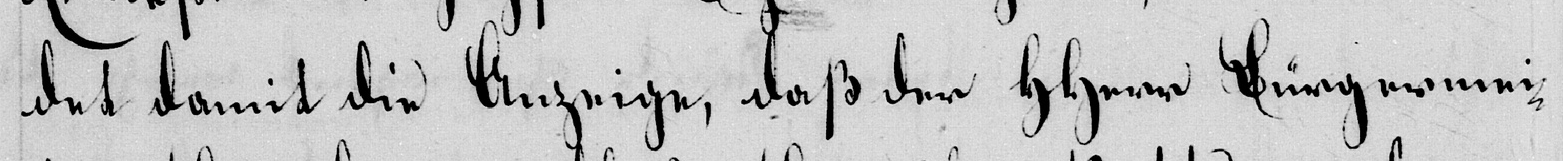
det damit die Anzeige, daß der HHerr Regierungsr¬
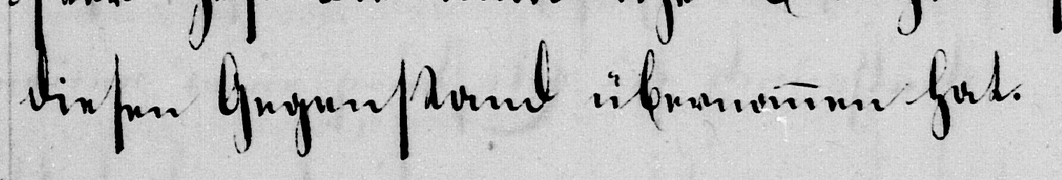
diesen Gegenstand übernommen hat.
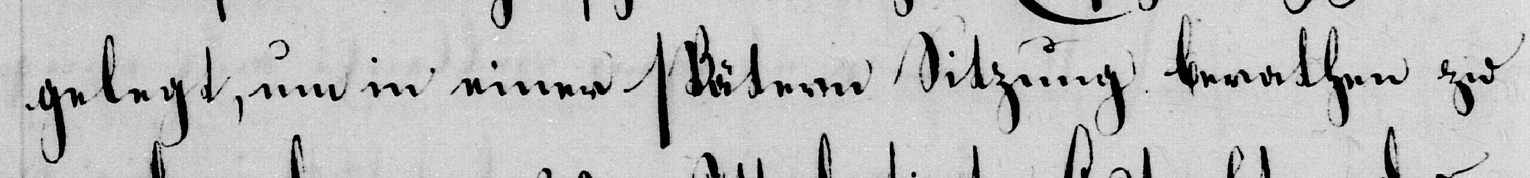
gelegt, um in einer spätern Sitzung berathen zu
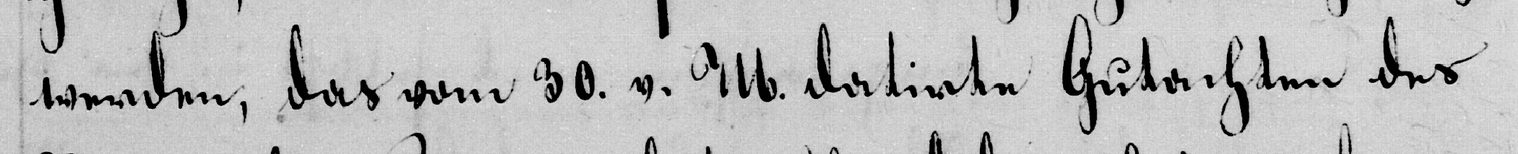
werden, das vom 30. v. M. datirte Gutachten des
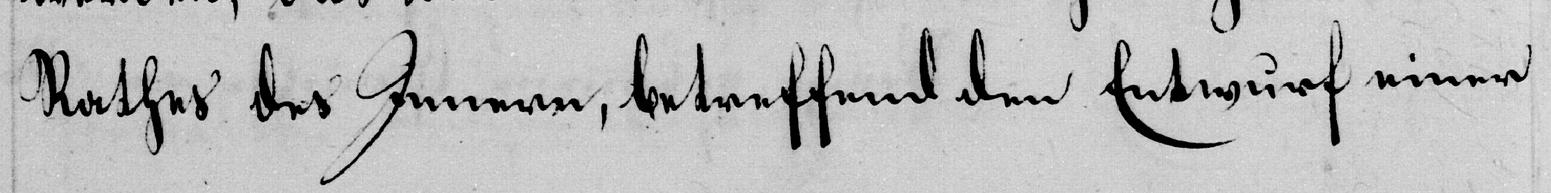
Rathes des Innern, betreffend den Entwurf einer
